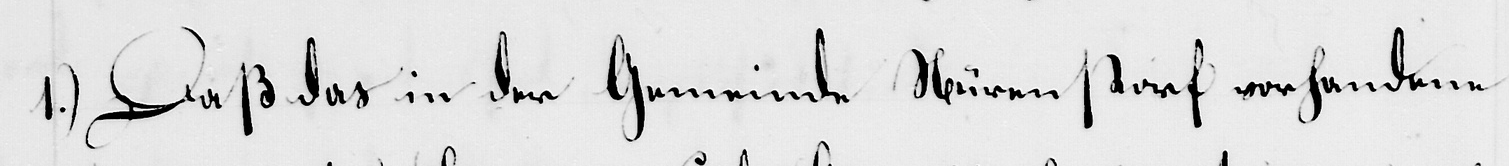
1.) Daß das in der Gemeinde Nürenstorf vorhandene
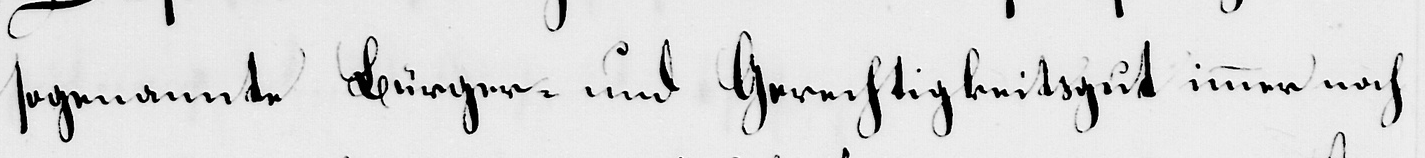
sogenannte Bürger- und Gerechtigkeitsgut immer noch
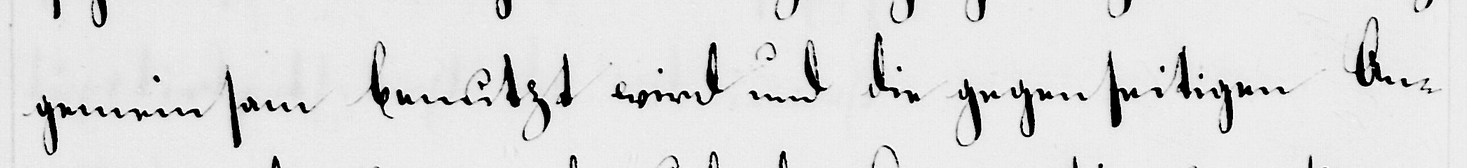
gemeinsam benutzt wird und die gegenseitigen An¬
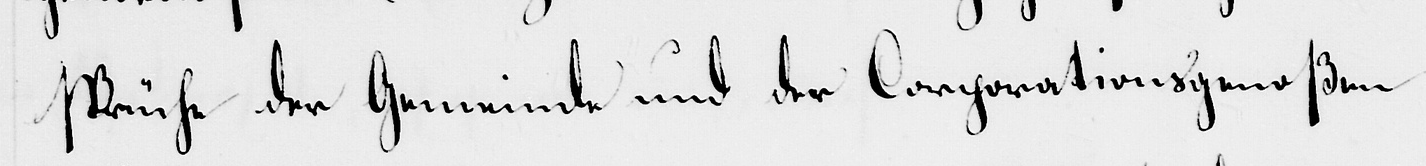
sprüche der Gemeinde und der Corporationsgenoßen
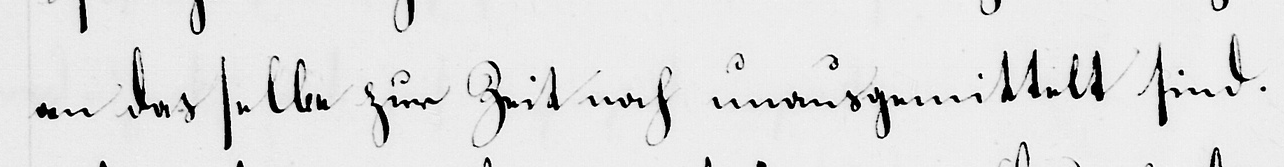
an dasselbe zur Zeit noch unausgemittelt sind.
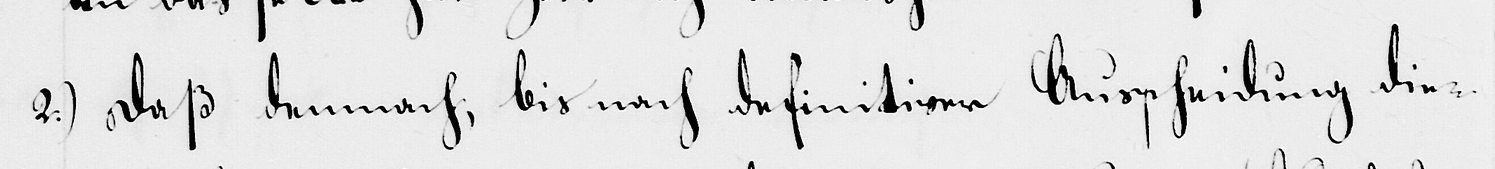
2.) Daß demnach, bis nach definitiver Ausscheidung die¬
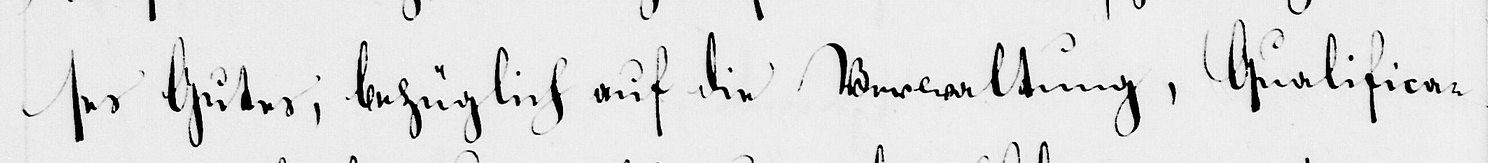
ses Gutes, bezüglich auf die Verwaltung, Qualifica¬
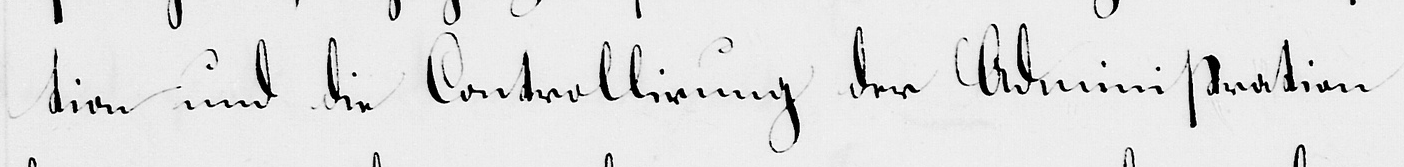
tion und die Controllirung der Administration
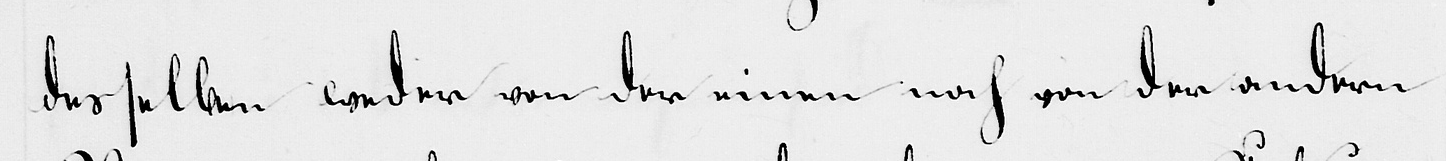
desselben weder von der einen noch von der andern
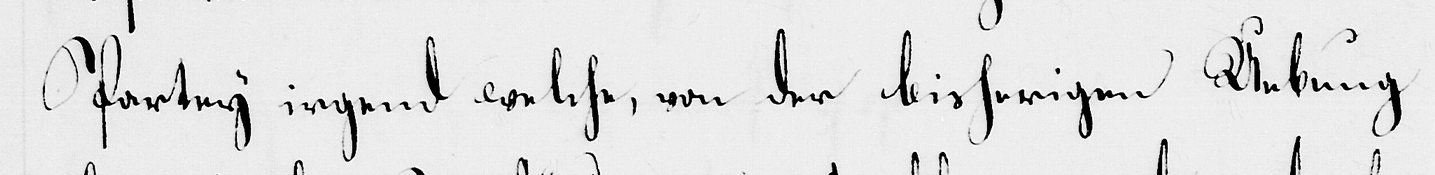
Partey irgend welche, von der bisherigen Uebung
